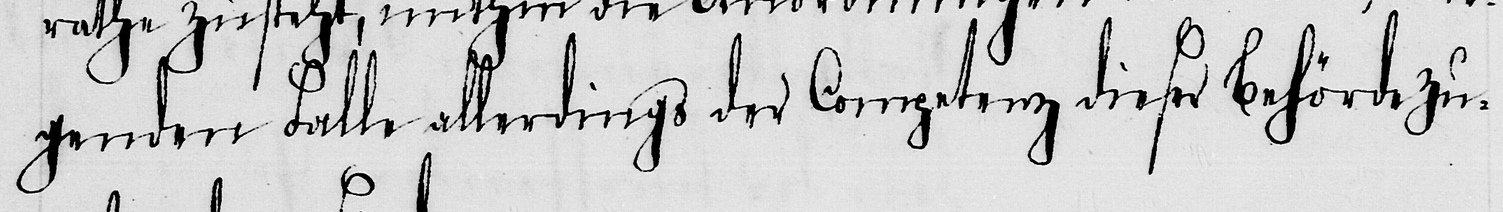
genden Falle allerdings der Competenz dieser Behörde zu¬
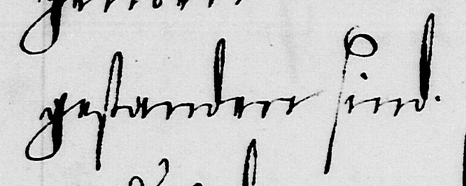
gestanden sind.
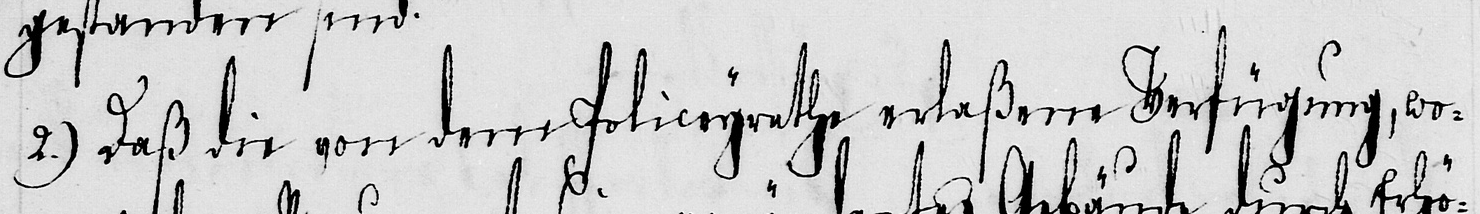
2.) Daß die von dem Policeyrathe erlaßene Verfügung, wo¬
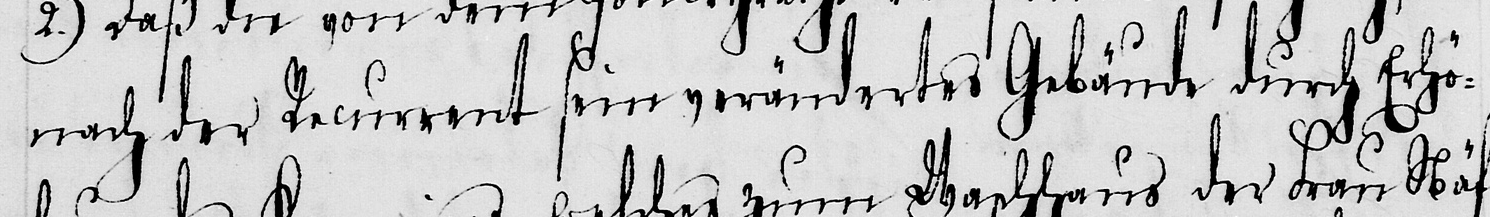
nach der Recurrent sein verändertes Gebäude durch Erhö¬
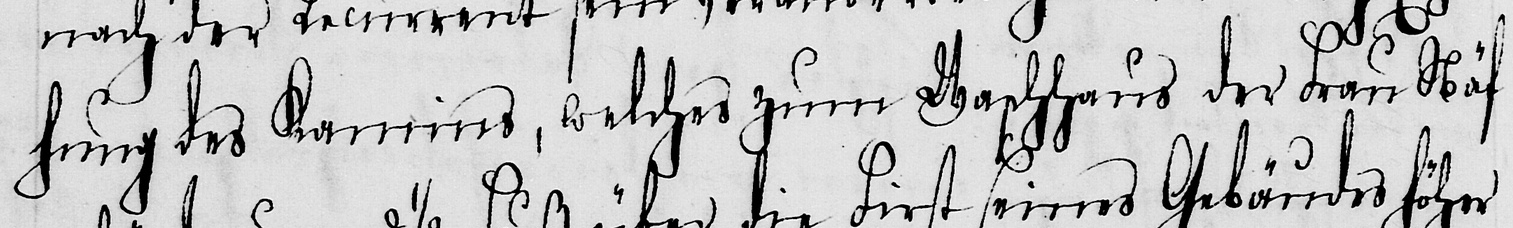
hung des Kamins, welches zum Waschhaus der Frau Näf
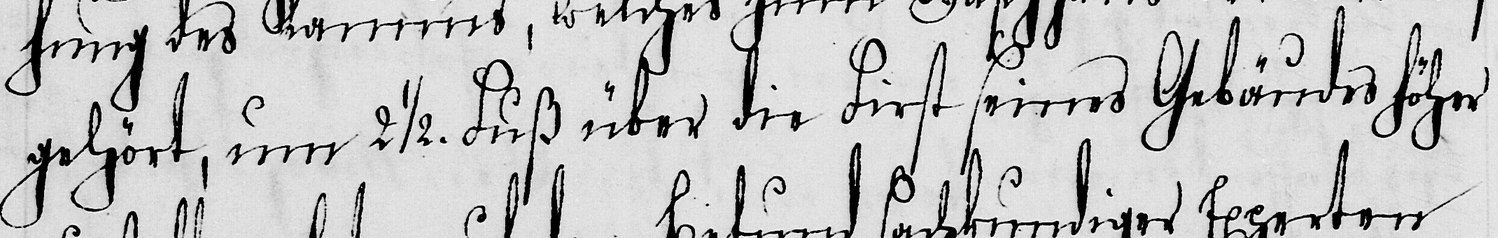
gehört, um 21/2. Fuß über die First seines Gebäudes höher
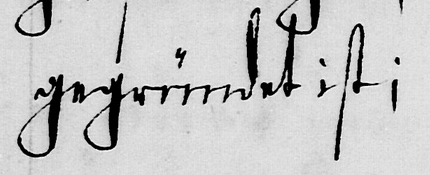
gegründet ist;
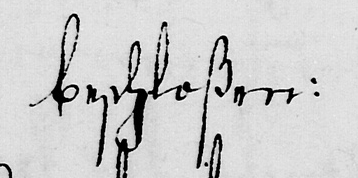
beschloßen:
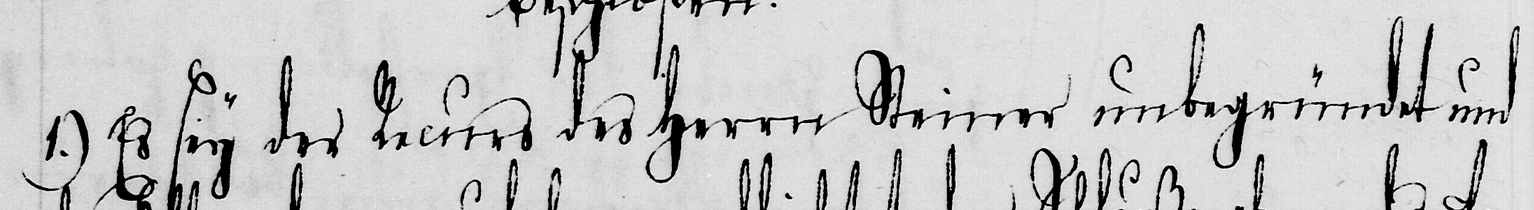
1.) Es sey der Recurs des Herrn Steiner unbegründet und
